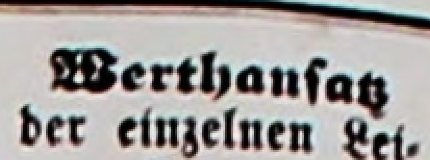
Werthansatz
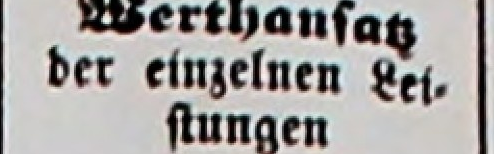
der einzelnen Lei=
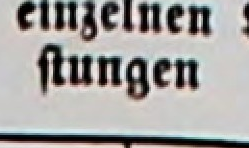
stungen
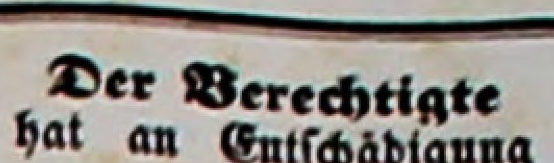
Der Berechtigte
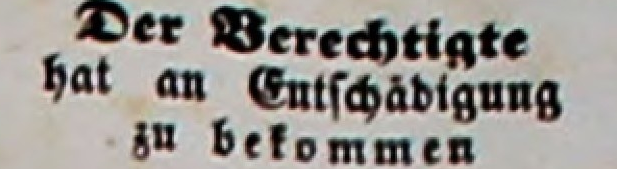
hat an Entschädigung
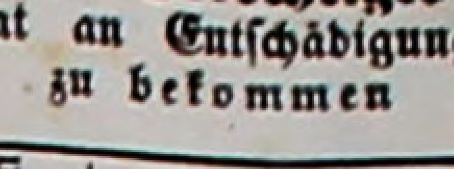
zu bekommen
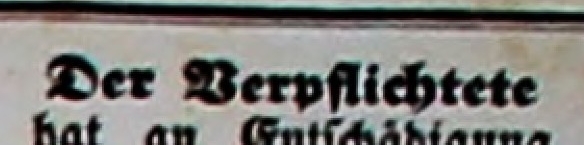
Der Verpflichtete
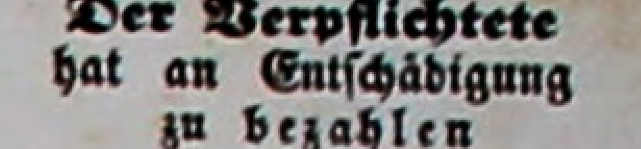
hat an Entschädigung
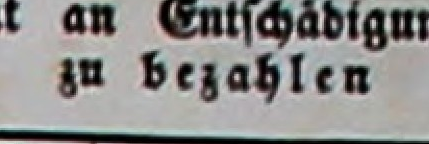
zu bezahlen
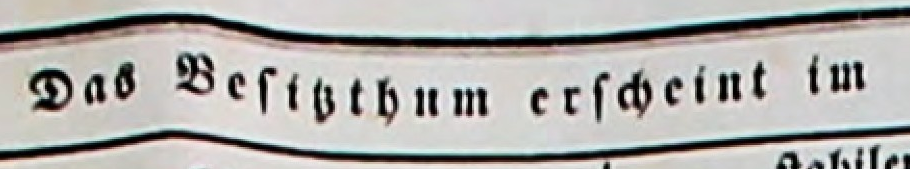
Das Besitzthum erscheint im
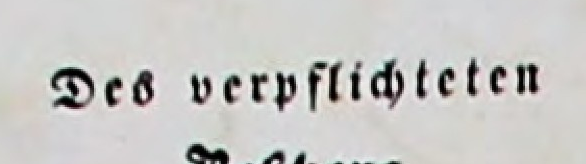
Des verpflichteten
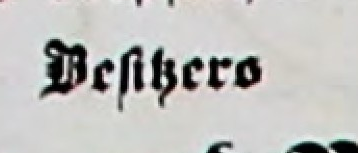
Besitzers
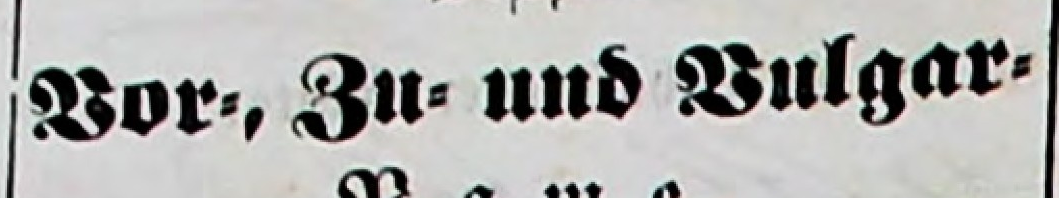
Vor=, Zu= und Vulgar=
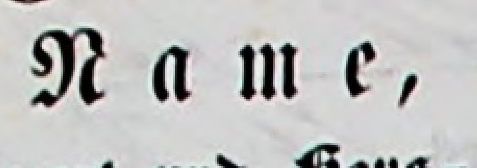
Name,
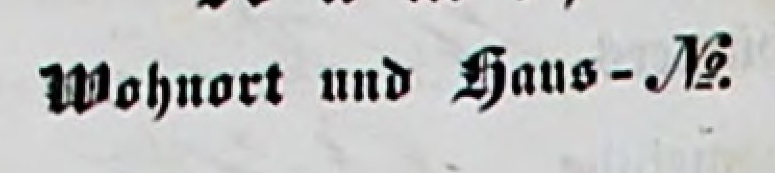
Wohnort und Haus - No.
